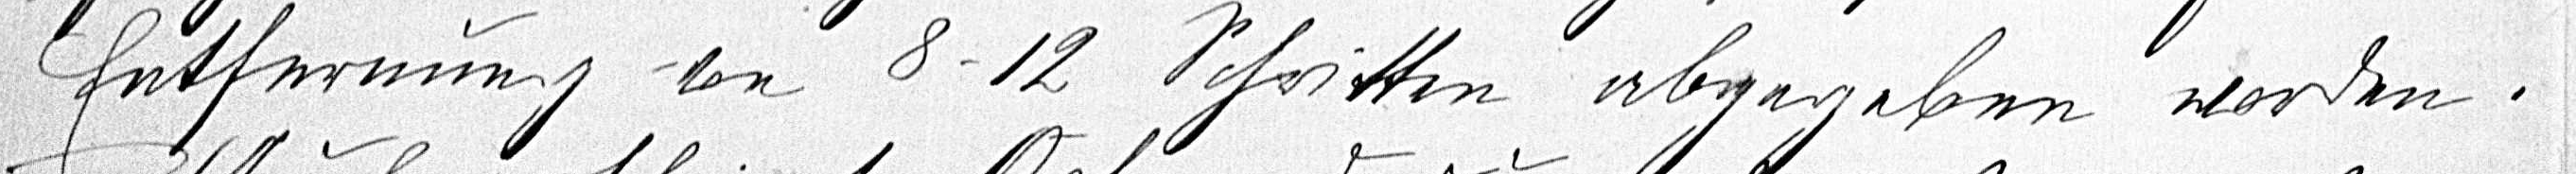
Entfernung xx 8-12 Schritten abgegeben worden.
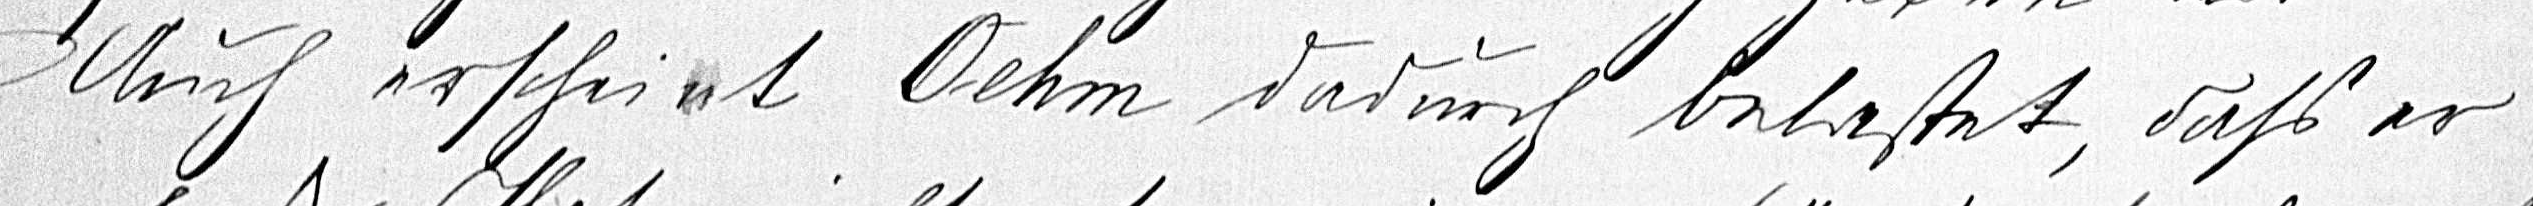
Auch erscheint Oehm dadurch belastet, dass er
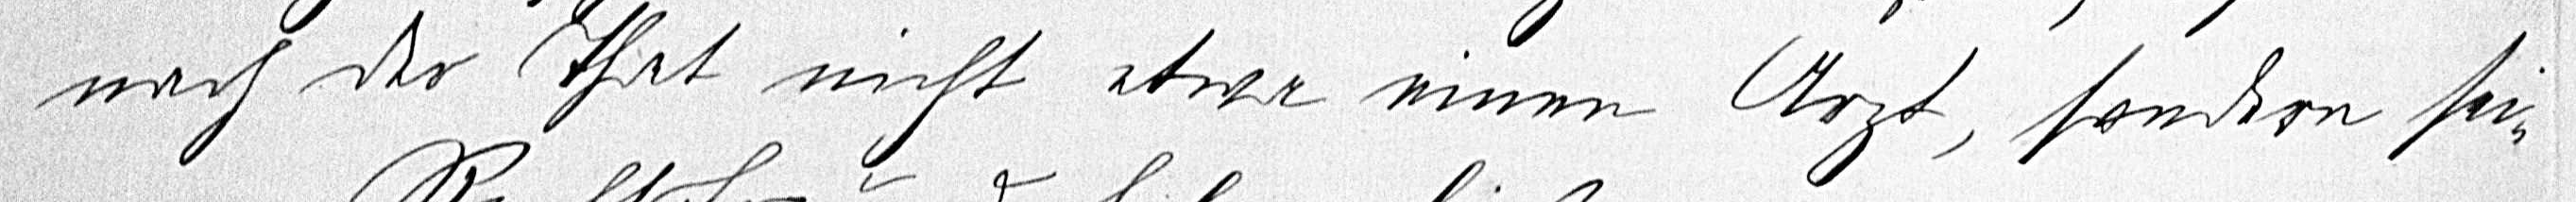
nach der That nicht etwa eien Arzt, sondern sei¬
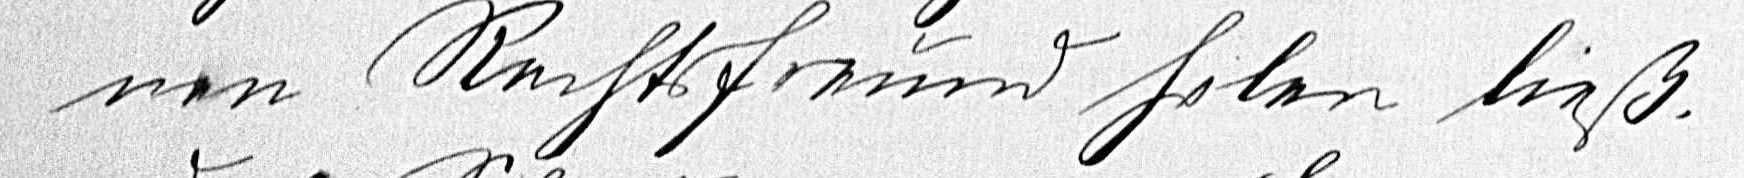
nen Rechtsfreund holen ließ.
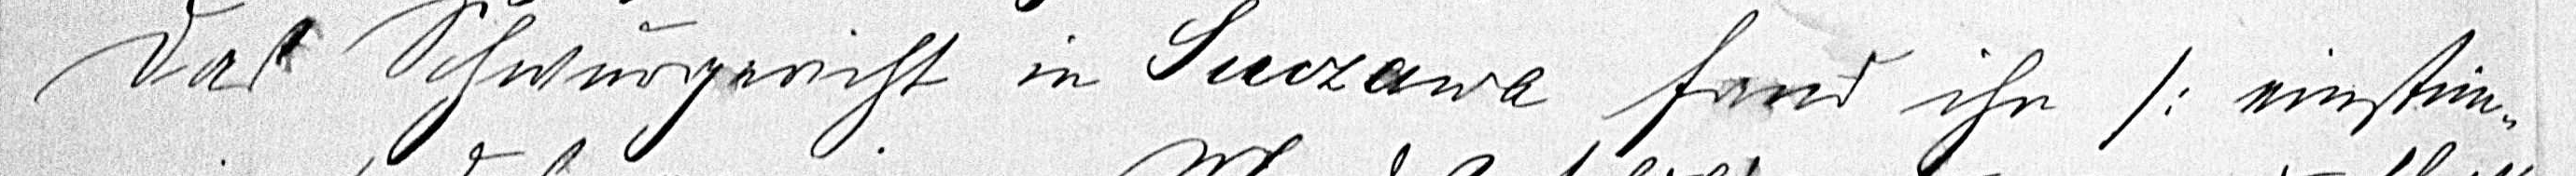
Das Schwurgericht in Suczawa fand ihn /: einstim¬
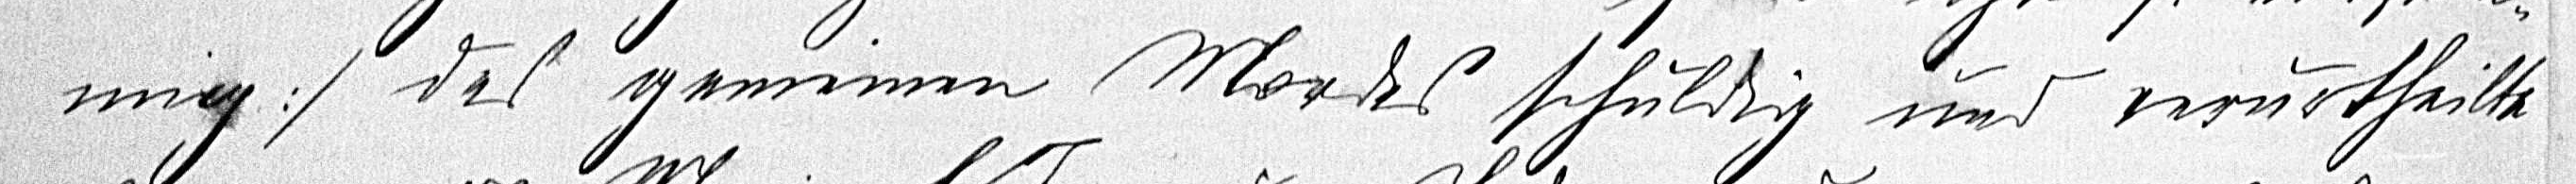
mig :/ des gemeinen Mordes schuldig und verurtheilte
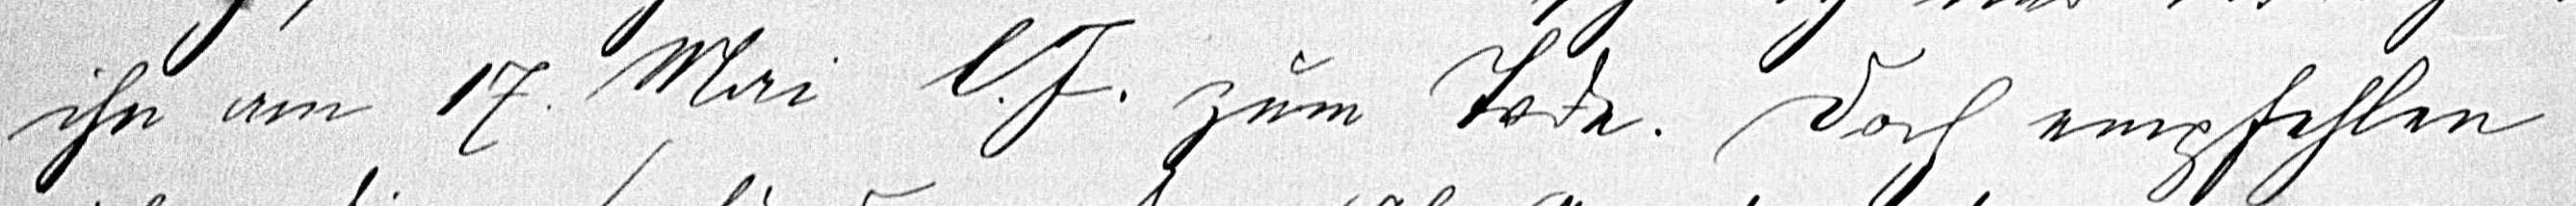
ihn am 17. Mai l.J. zum Tode. Doch empfehlen
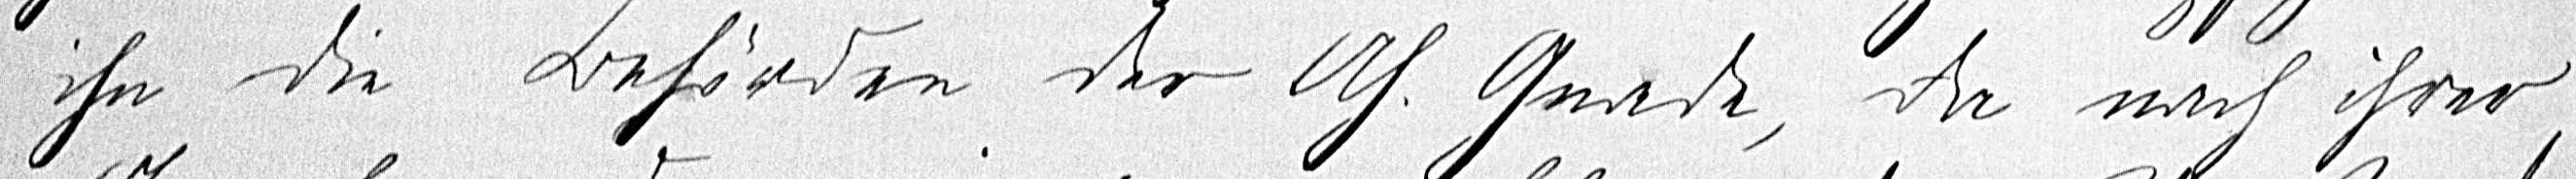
ihn die Behörden der Ah. Gnade, da nach ihrer
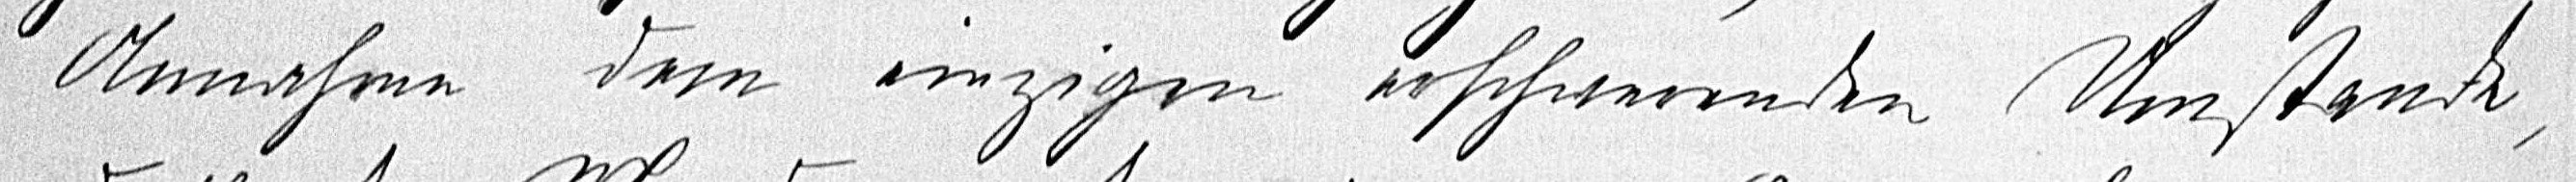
Annahme dem einzigen erschwerenden Umstande,
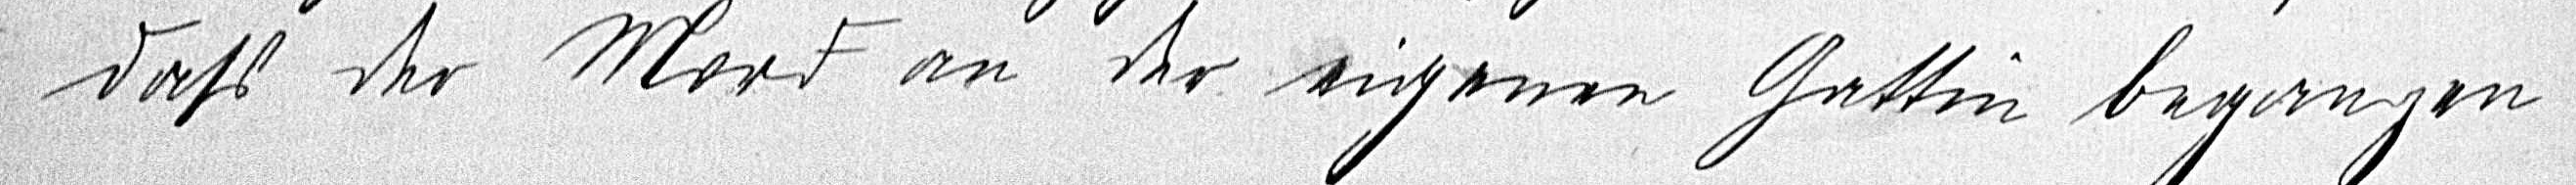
dass der Mord an der eigenen Gattin begangen
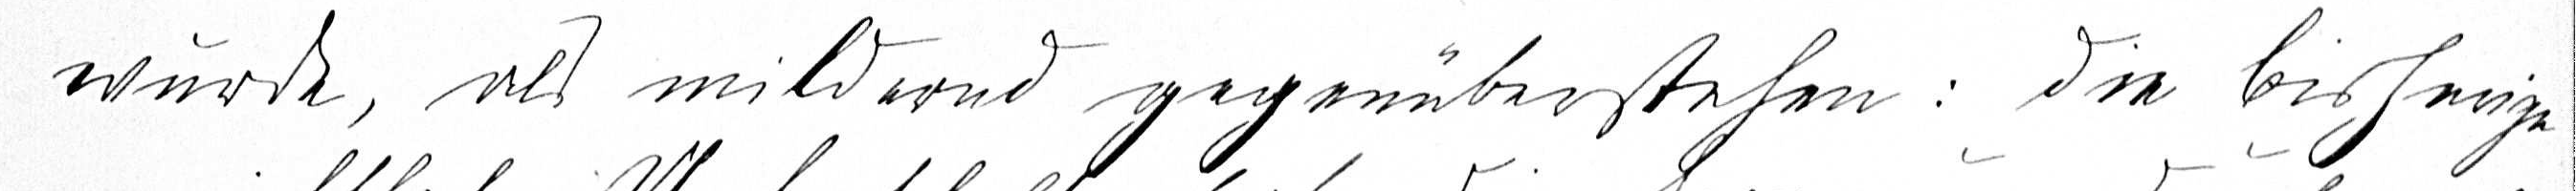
wurde, als mildernd gegenüberstehen: die bisherige
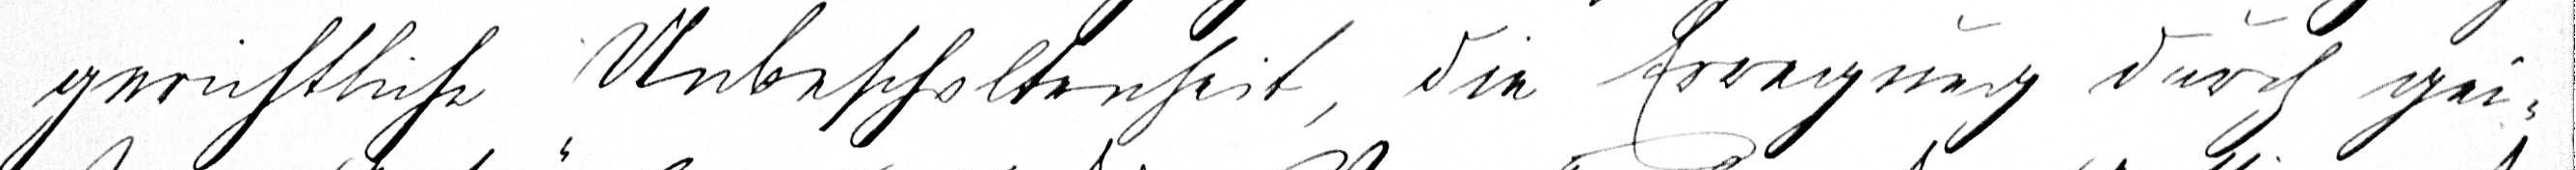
gerichtliche Unbescholtenheit, die Erregung durch gei¬
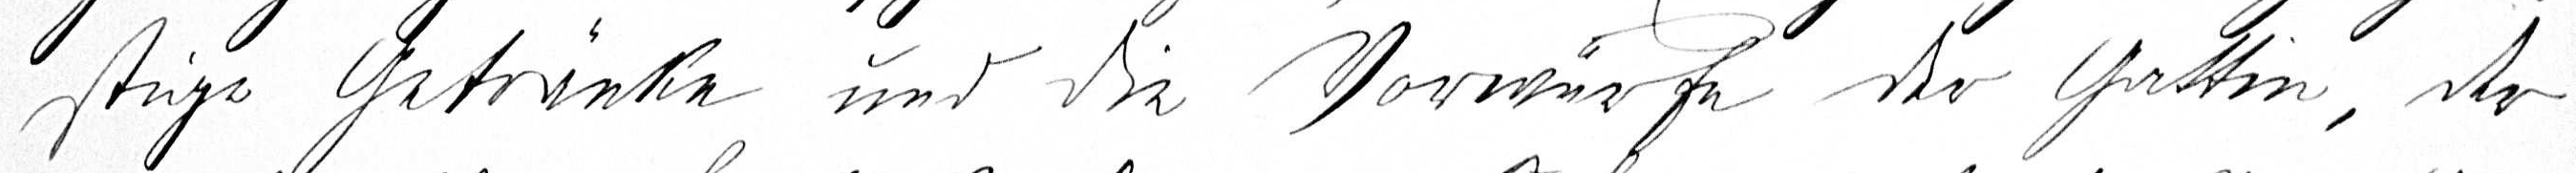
stige Getränke und die Vorwürfe der Gattin, der
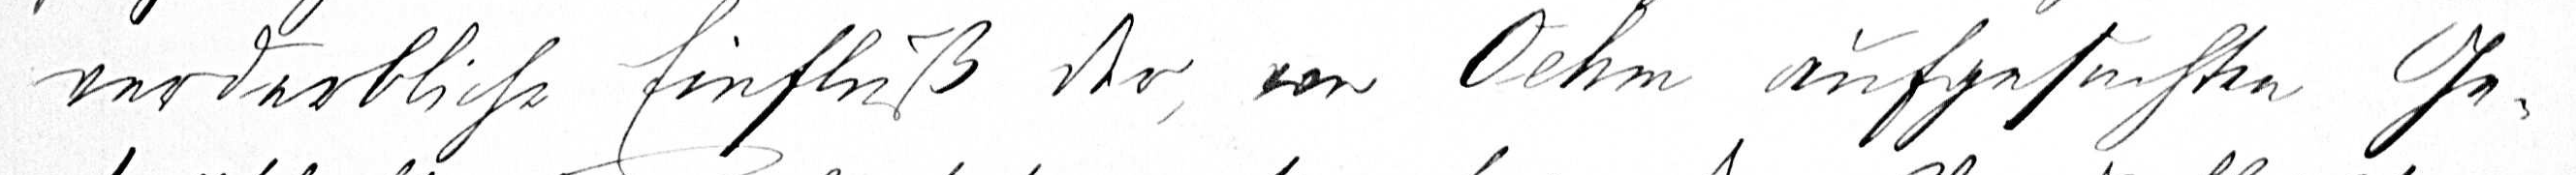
verderblicht Einfluß der, von Oehm aufgesuchten Ge¬
